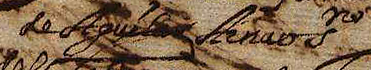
de Aguilar Arnao Sno
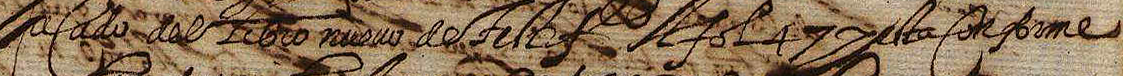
SaCado del Libro nueuo de Testif.es A fol 47 y esta Conforme
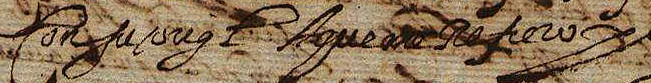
Con su origL A que me Refiero yo
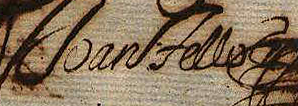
Joan tello
